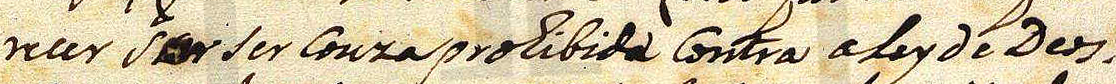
recer ser ser couza prohibida contra a Ley de Deos,
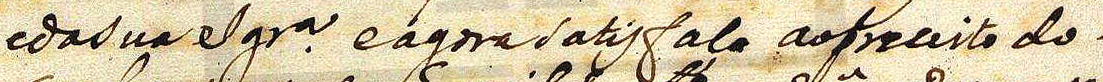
e da sua Igr.a, e agora satisfaço ao preceito do
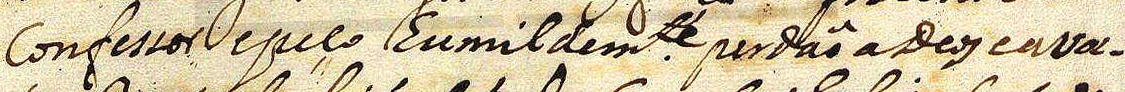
Confessor e peço humildem.te perdaõ a Deos e a vos
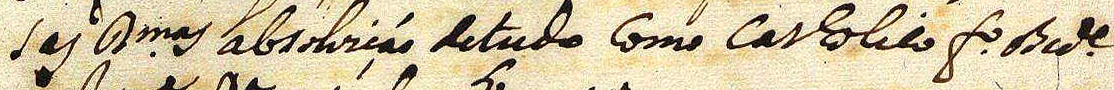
sas R.mas absolvição de tudo Como Catholico f.o obed.e
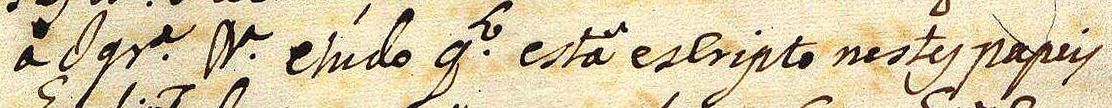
a Igr.a. &.a e tudo q.to estâ escripto nestes papeis
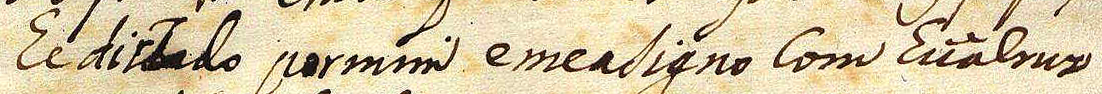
he dictado por mim e me asigno Com huā cruz
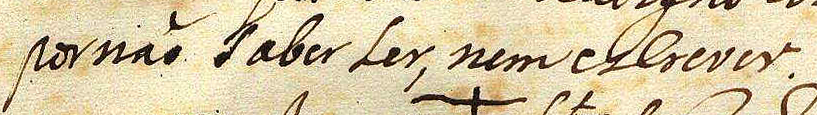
por não saber Ler, nem esCrever.
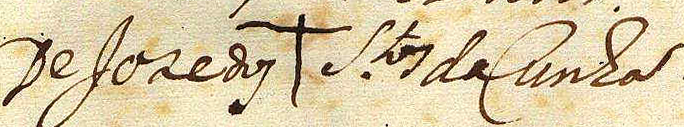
De Joze dos S.tos da Cunha
